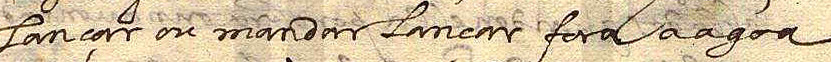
Lançar ou mandar Lançar fora a agoa
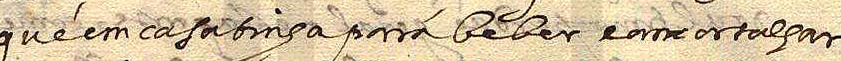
que em casa tinha para beber e amortalhar
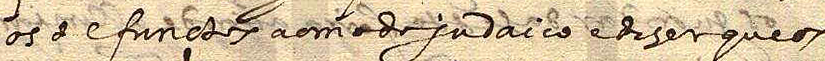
os defunctos ao modo judaico e dizer que os
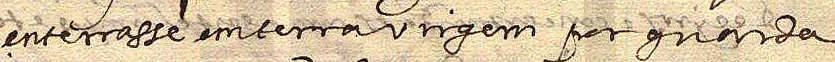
enterrassẽ em terra virgem por guarda
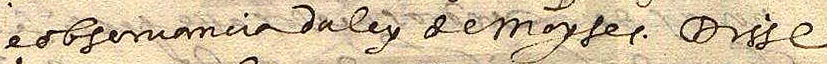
e obseruancia da ley de moyses. Disse
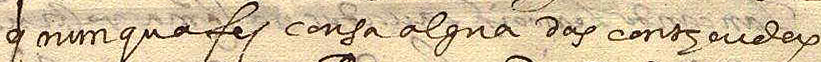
q̄ nunqua fez cousa algua das contheudas
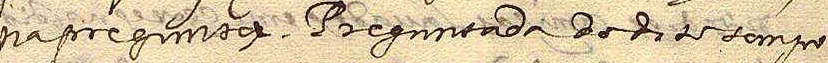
na pregunta. Preguntada do dito tempo
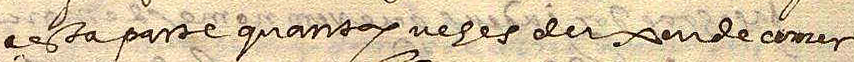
a esta parte quantas uezes deixou de comer
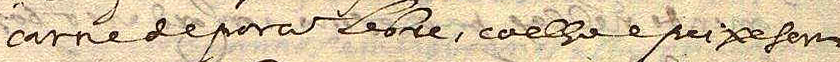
carne de porco Lebre, coelho e peixe sem
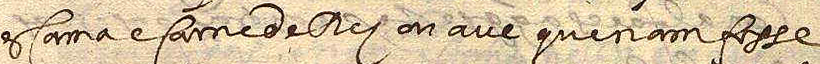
esCama e Carne de Res ou aue que nam fosse
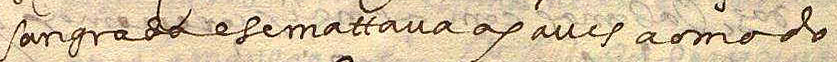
sangrada e se mattaua as aues ao modo
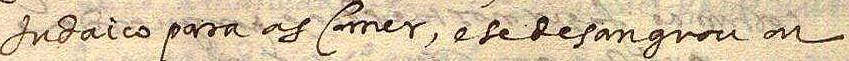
Judaico para as Comer, e se desangrou ou
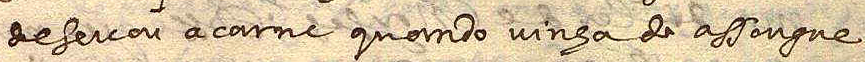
descuou a carne quando uinha do assougue
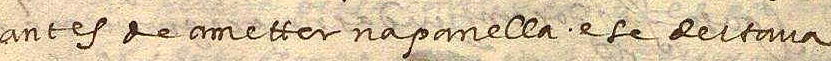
antes de a metter na panella. e se deitaua
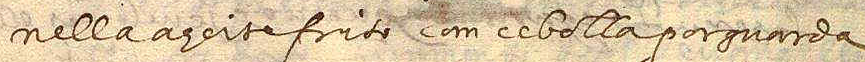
nella azeite frito com cebolla por guarda
